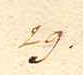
19.
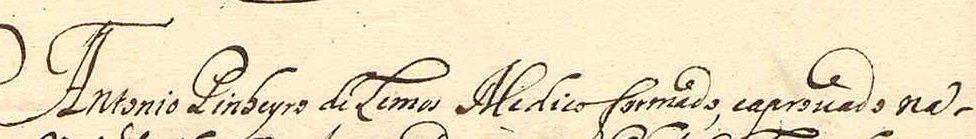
Antonio Pinheyro de Lemos Medico formado, e aprouado na
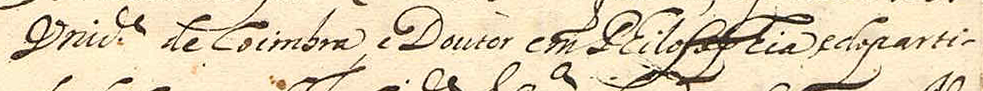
Vnid.e de Coimbra e Doutor em Philosophia e do parti
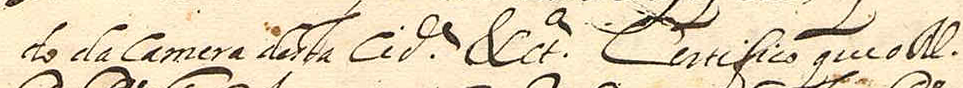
do da Camera desta Cid.e &ct.a Certifico que o M.
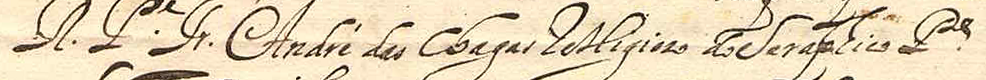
R. P.e Fr. André das Chagas Relligiozo do Seraphico P.e
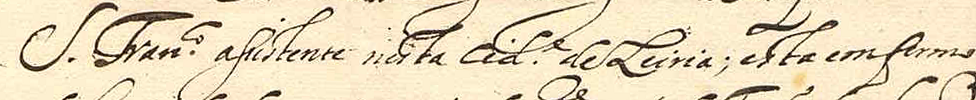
S. Fran.co assistente nesta Cid.e de Leiria; esta emfermo
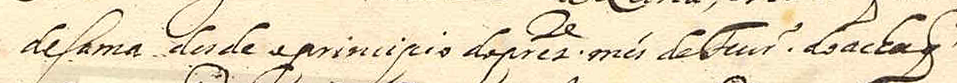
de Cama desde o principio do prez.te més de Feur.o do achaq̄
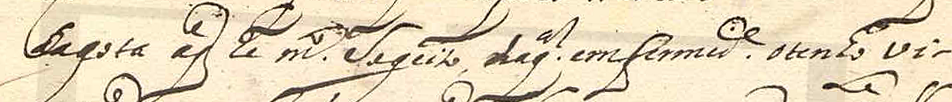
da gota a q̄ he m.to Sogeito, da q.al emfermid.e o tenho vi
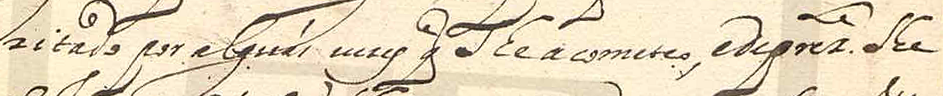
zitado por alguās uezes q̄ lhe acometeo, e de prez.te lhe
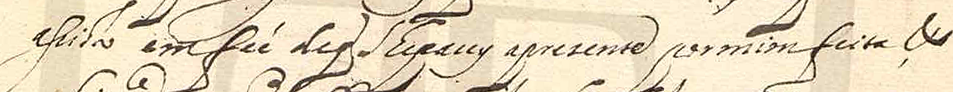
assisto em feé de q̄ lhe pacey a prezente por mim feita &
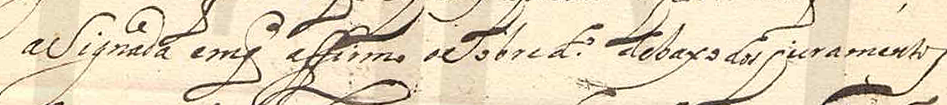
aSignada em q̄ affirmo o Sobred.o debaxo dos juramentos
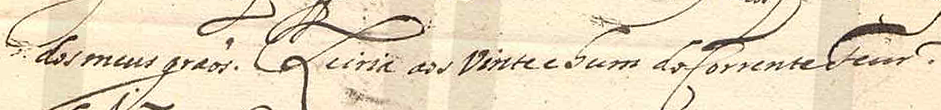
dos meus graos. Leiria aos Vinte e hum do Corrente Feur.o
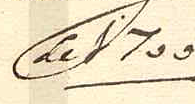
de 1700
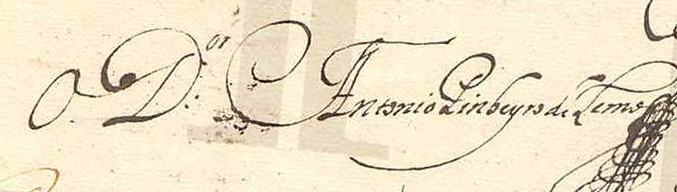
O D.or Antonio Pinheyro de Lemos
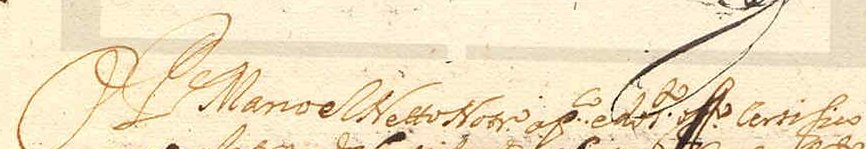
O Pe Manoel Netto Notro ap.co do s.to off.o certifico
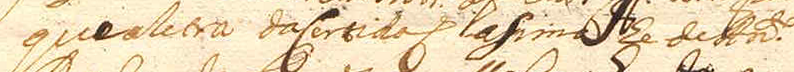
que a letra da Certidaõ asima he de An.to
